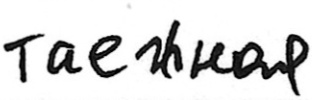таежная
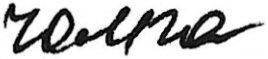чомга
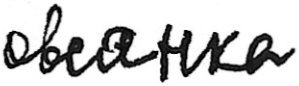овсянка
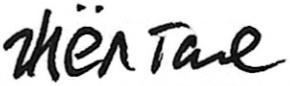жёлтая
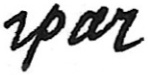грач
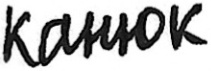канюк
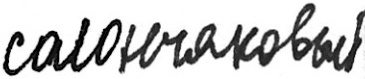солончаковый
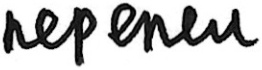перепел
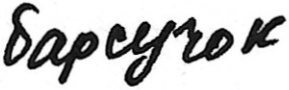барсучок
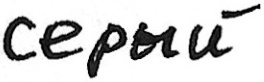серый
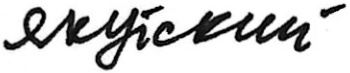якутский
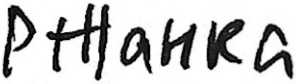ржанка
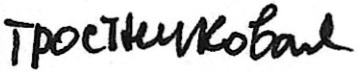тростниковая
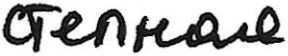степная
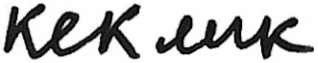кеклик
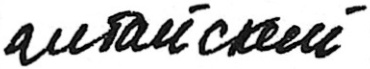алтайский
